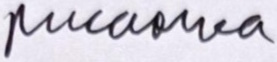ржанка
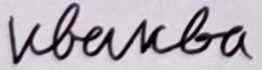кваква
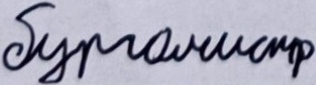бургомистр
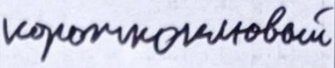короткоклювый
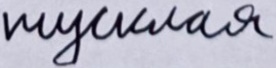тусклая
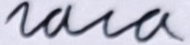гага
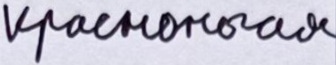красноныая
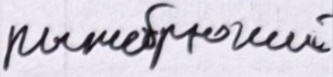рыжебрюхий
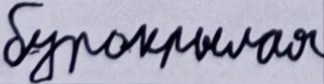бурокрылая
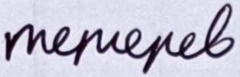тетерев
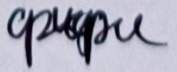фифи
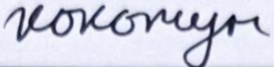хохотун
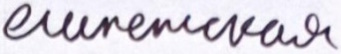египетская
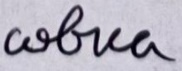совка
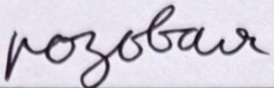розовая
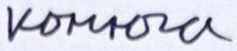конюга
